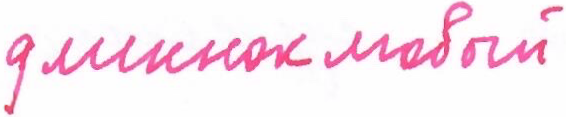длинноклювый
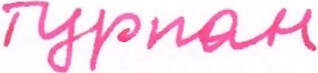турпан
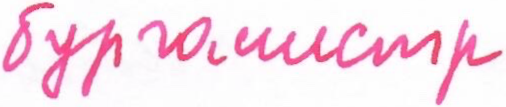бургомистр
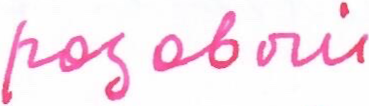розовый
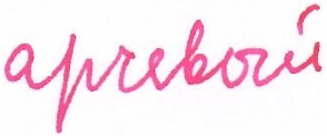арчевый
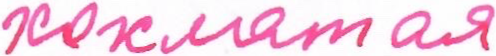хохлатая
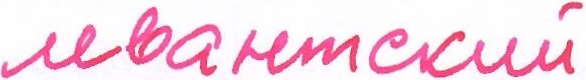левантский
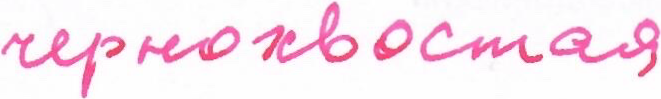чернохвостая
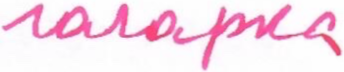гагарка
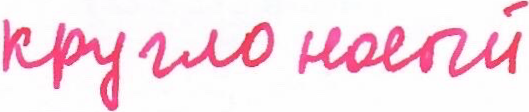кругло носый
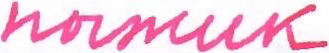пыжик
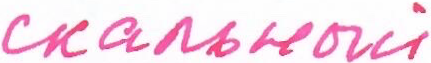скальный
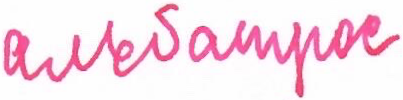альбатрос
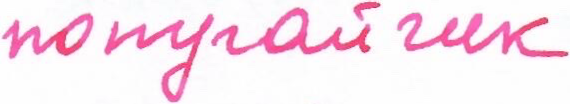попугайчик
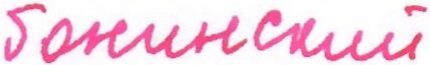бонинский
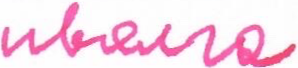иволга
